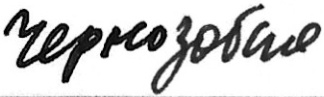чернозобая
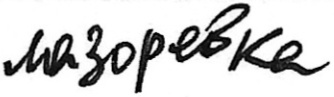лазоревка
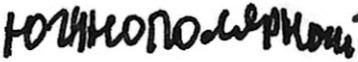южнополярный
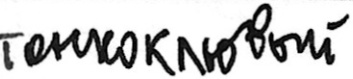тонкоклювый
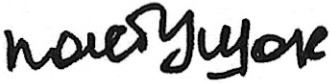пастушок
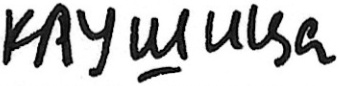клушица
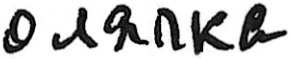оляпка
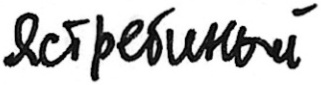ястребиный
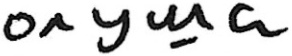олуша
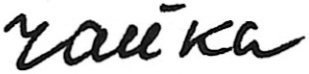чайка
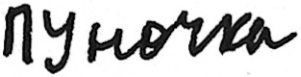пуночка
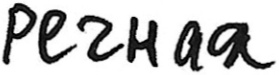речная
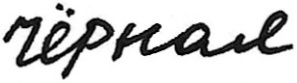чёрная
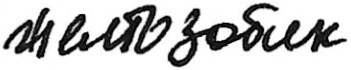желтозобик
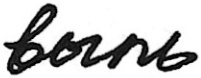выпь
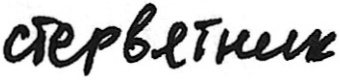стервятник
